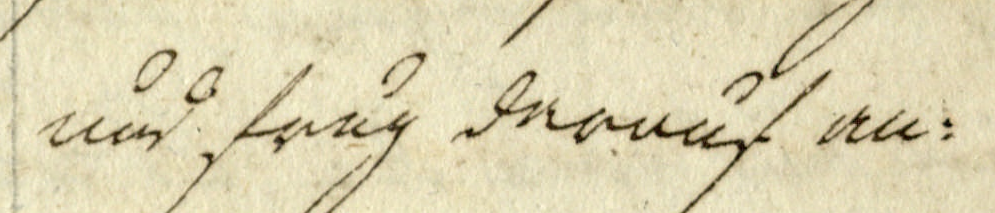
und frug darauf an:
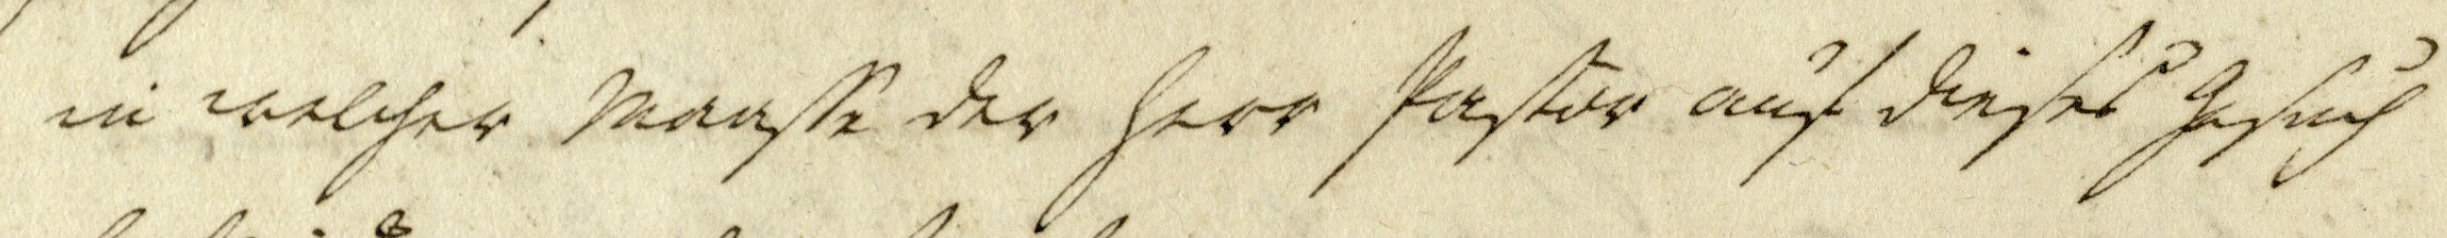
in welcher Maasse der herr Pastor auf dieses Gesuch
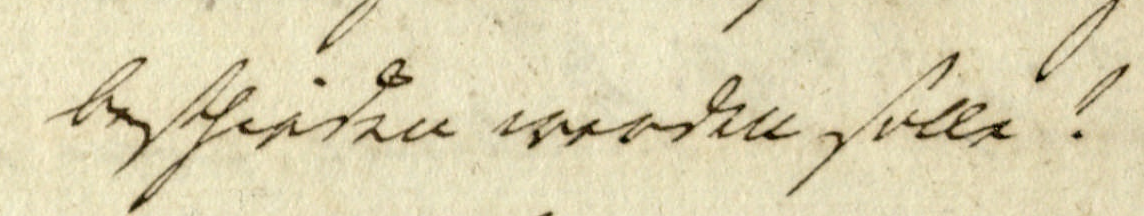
beschieden werden solle!
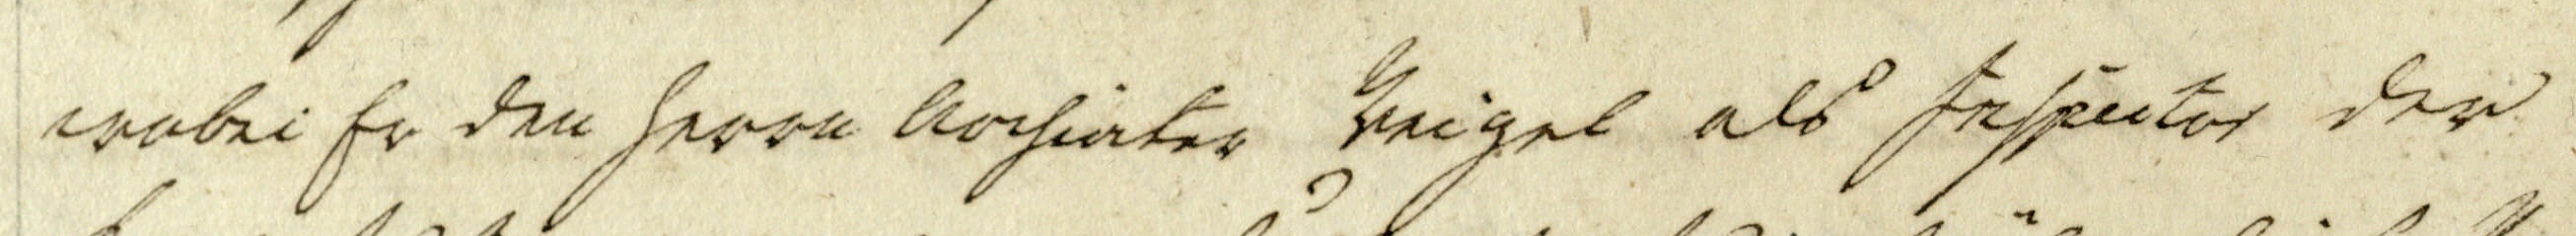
wobei Er den herrn Archiater Weigel als Inspector der
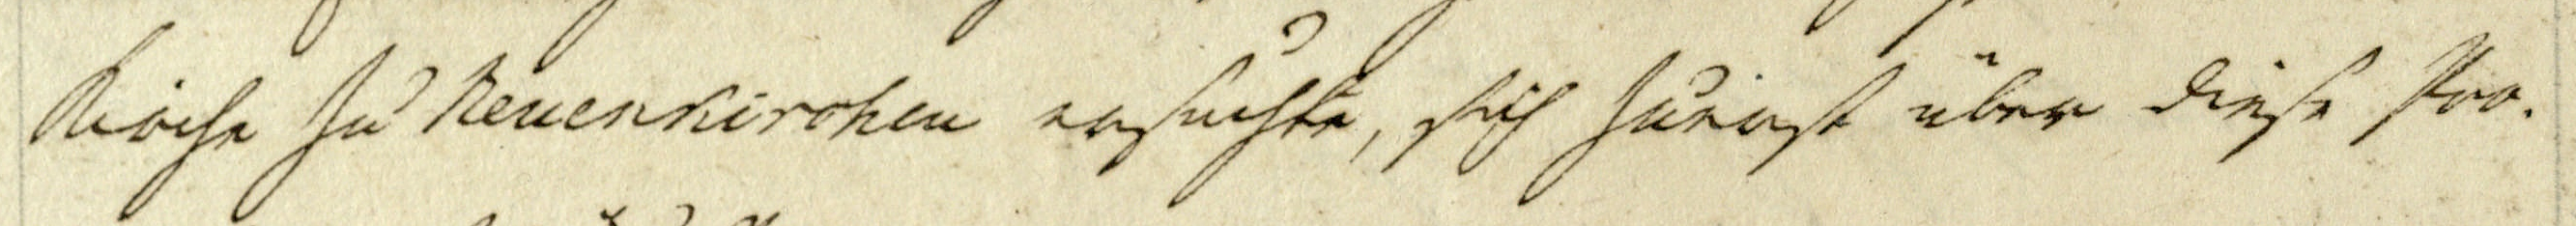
Kirche zu Neuenkirchen ersuchte, sich zuerst über diese Pro¬
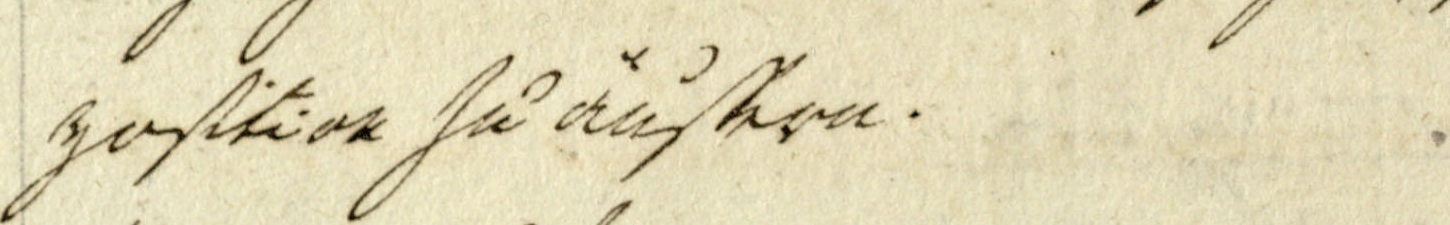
position zu äussern.
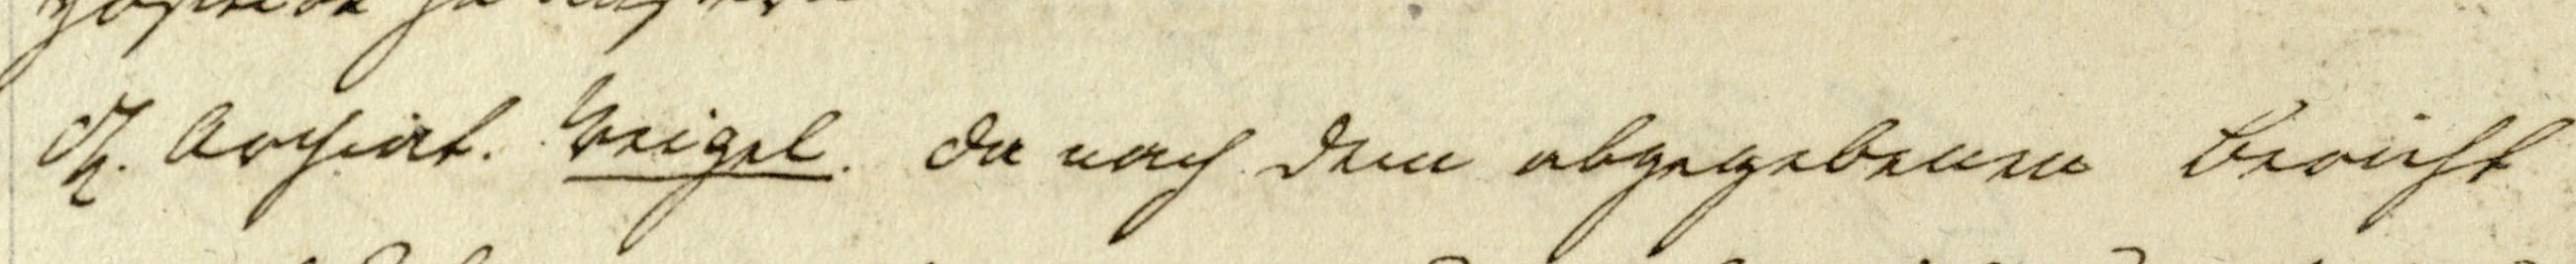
dh. Archiat. Weigel. da nach dem abgegebenen Bericht
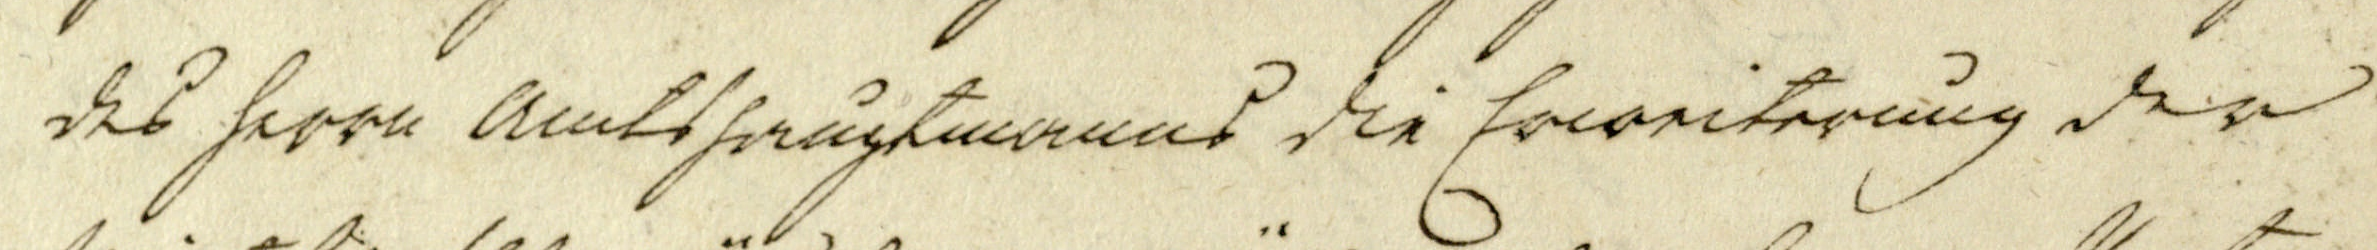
des herrn Amtshauptmanns die Erweiterung der
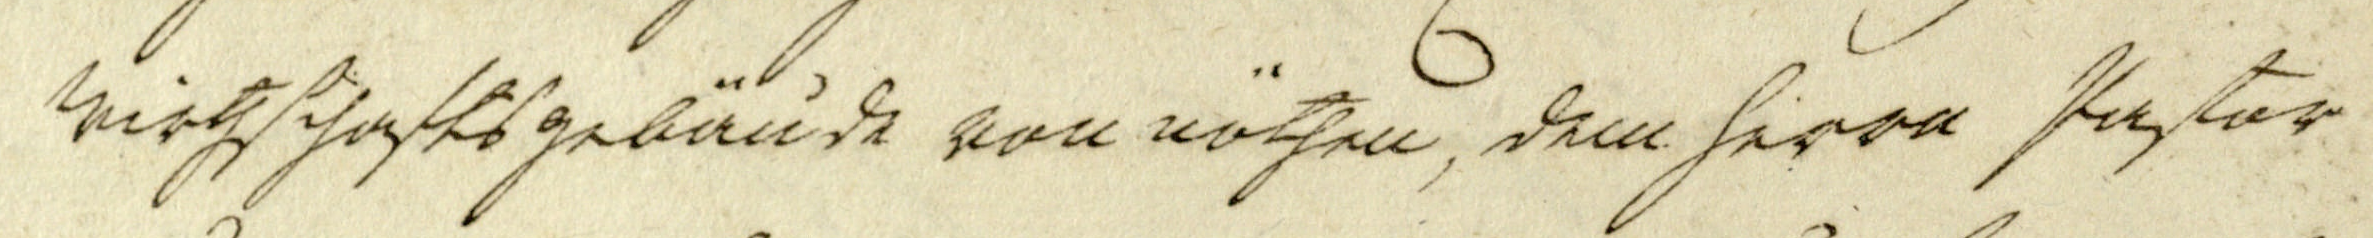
Wirthschaftsgebäude von nöthen, dem herrn Pastor
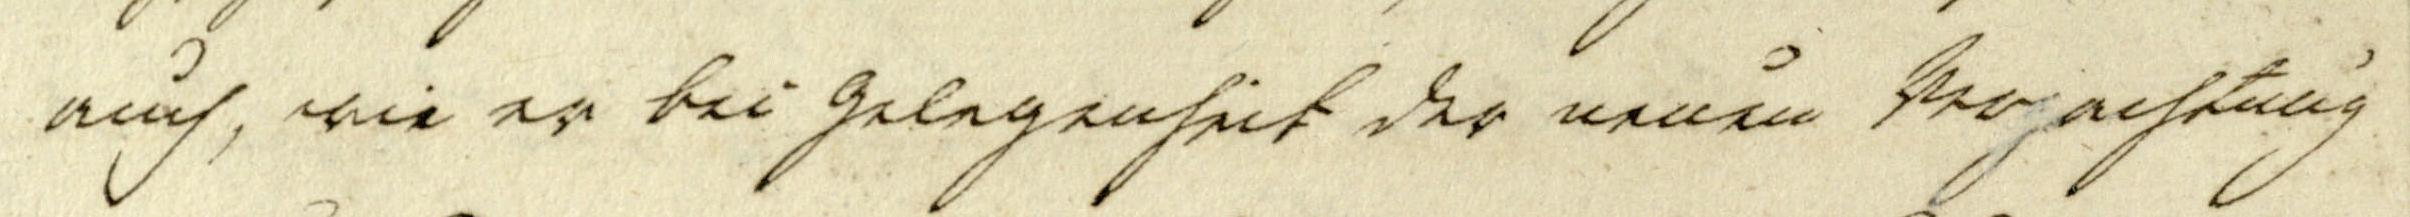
auch, wie er bei Gelegenheit der neuen Verpachtung
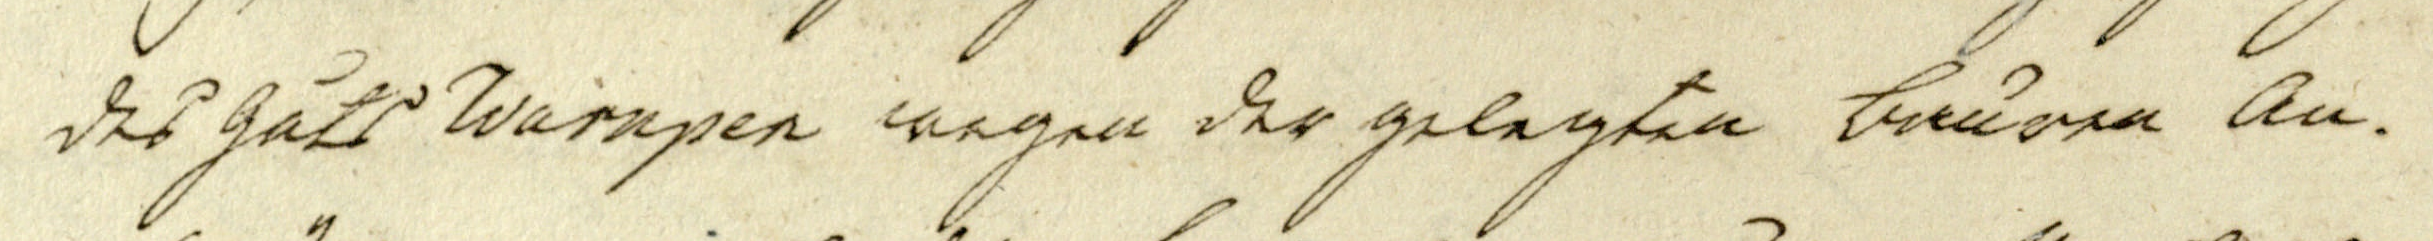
des Guts Wampen wegen der gelegten Bauren An¬
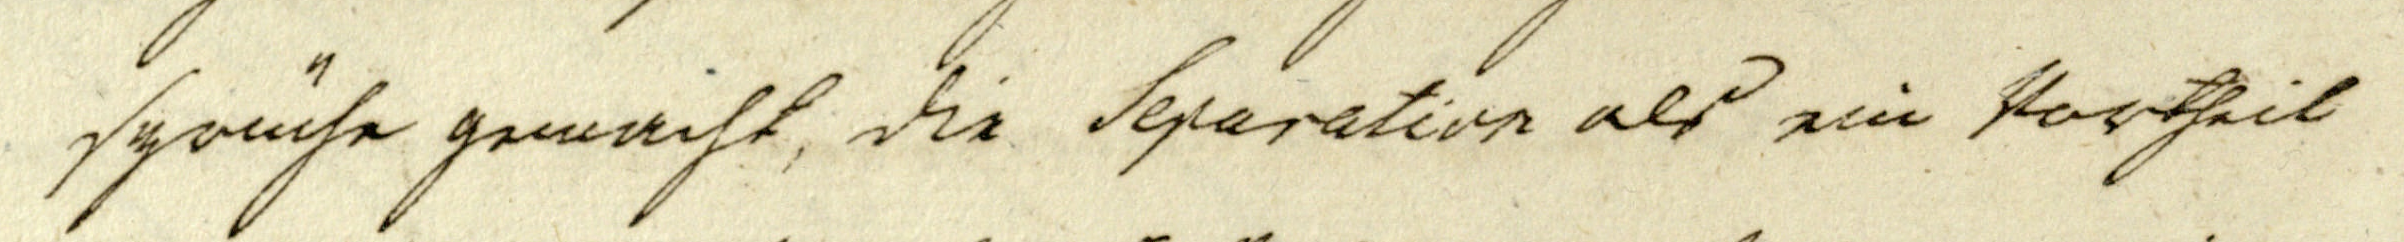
sprüche gemacht, die Separation als ein Vortheil
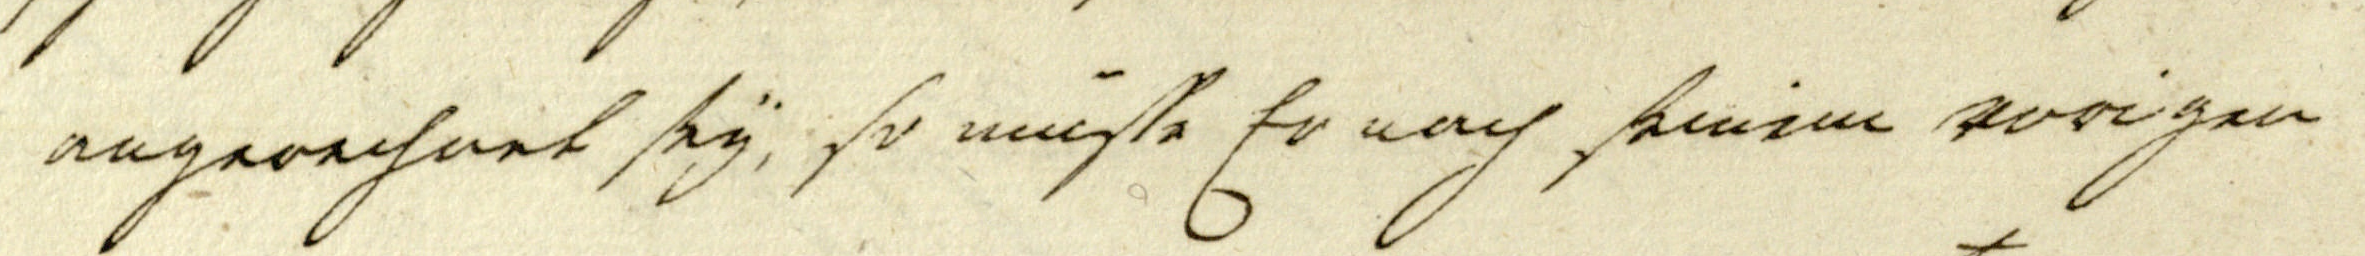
angerechnet seÿ, so müsse Er nach seinem vorigen
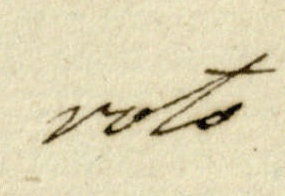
voto
